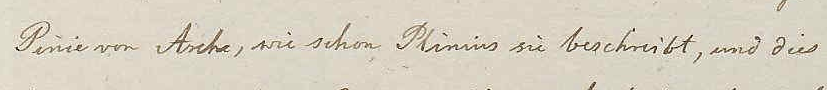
Pinie von Asche, wie schon Plinius sie beschreibt, und dies
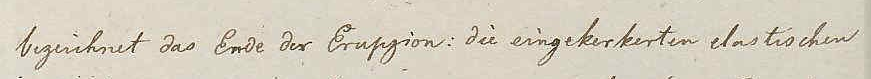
bezeichnet das Ende der Erupzion: die eingekerkerten elastischen
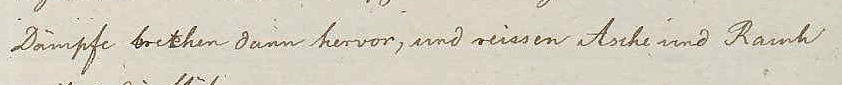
Dämpfe tbretchen dann hervor, und reissen Asche und Rauch
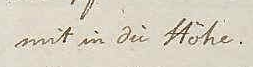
mit in die Höhe.
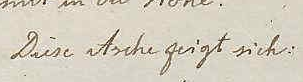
Diese Asche zeigt sich:
